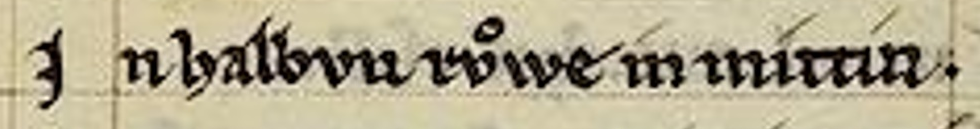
In halbvn rv°owe in mittin.
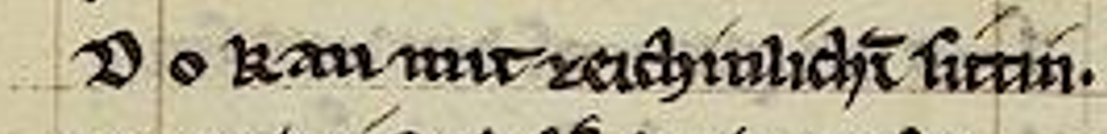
Do kan mit zeichinlichi(n) ſittin.
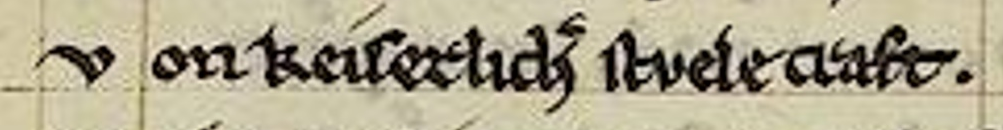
Von keiſerlich(er) ſtvele craft.
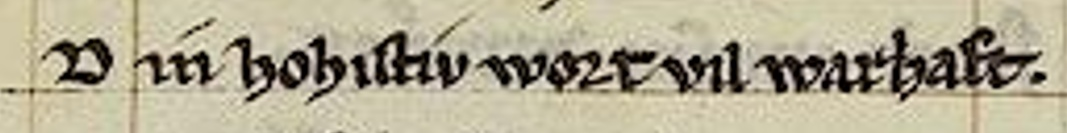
Din hohiſtiv wort vil warhaft.
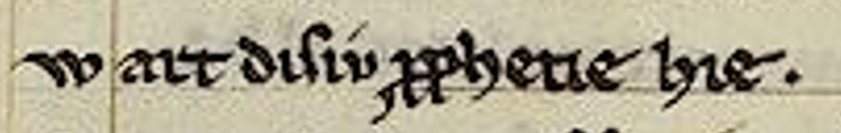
Wart diſiv ?pphetie hie.
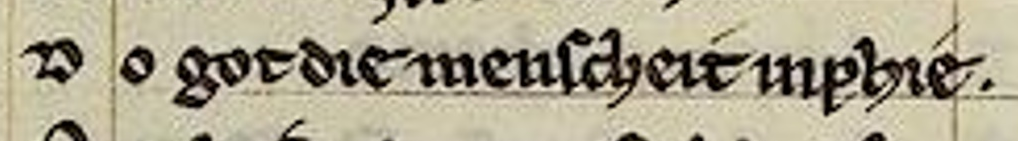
Do got die menſcheit inphie.
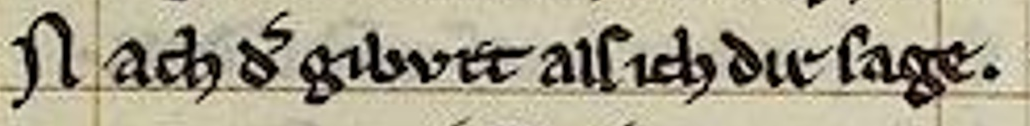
Nach d(er) gibvrt alſ ich dir ſage.
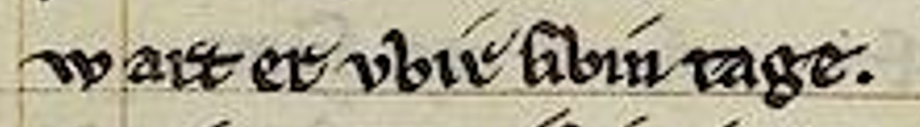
Wart er vbir ſibin tage.
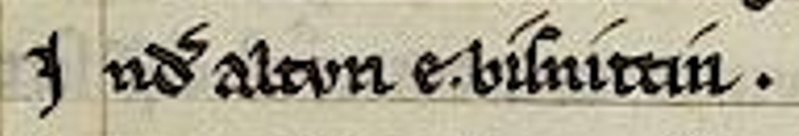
Ind(er) altvn e. biſnittin.
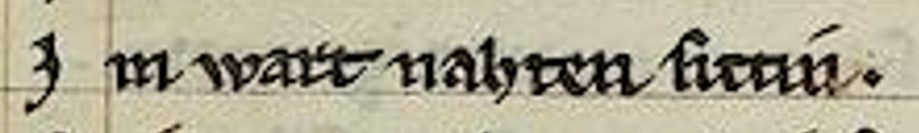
Im wart nahten ſittin.
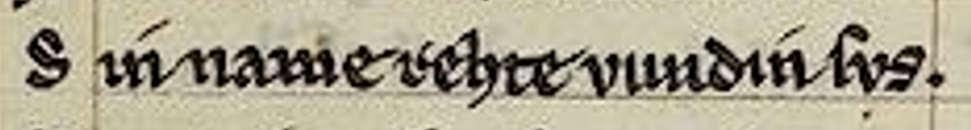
Sin name rehte vundin ſvs.
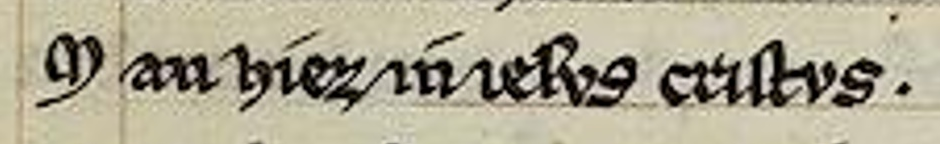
Man hiez in ieſvs criſtvs.
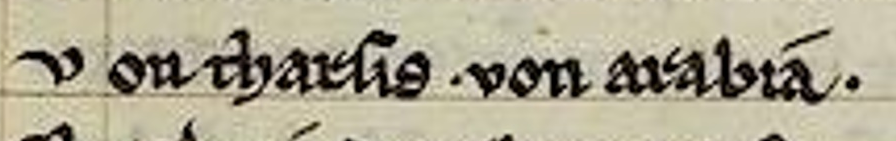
Von tharſis. von arabia.
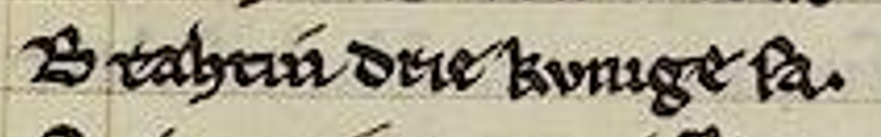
Brahtin drie kvnige ſa.
